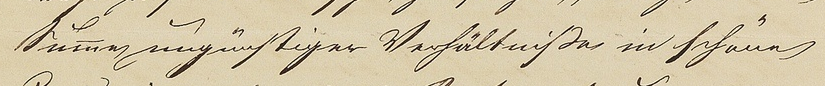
Summe ungünstiger Verhältniße in schöne
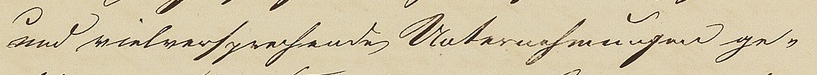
und vielversprechende Unternehmungen ge-
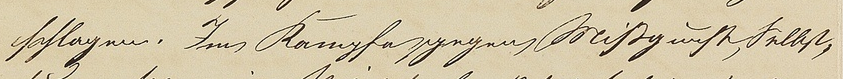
schlagen. Im Kampfe gegen Mißgunst, Selbst-
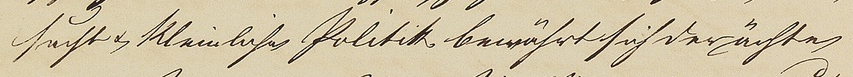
sucht & kleinliche Politik bewährt sich der ächte
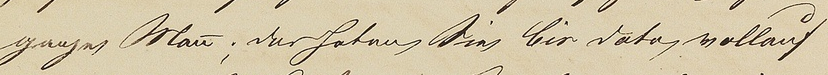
ganze Mann; das haben Sie bis dato vollauf
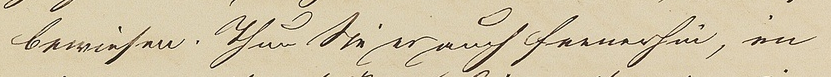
bewiesen. Thun Sie es auch fernerhin, im
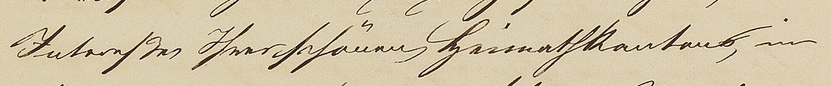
Intereße Ihres schönen Heimathkantons, im
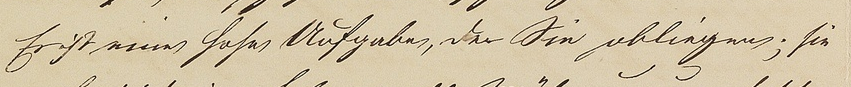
Es ist eine hohe Aufgabe, der Sie obliegen; sie
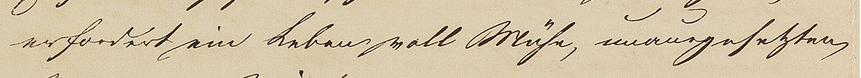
erfordert ein Leben voll Mühe, unausgesetzten
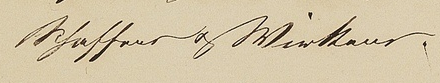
Schaffens & Wirkens.
